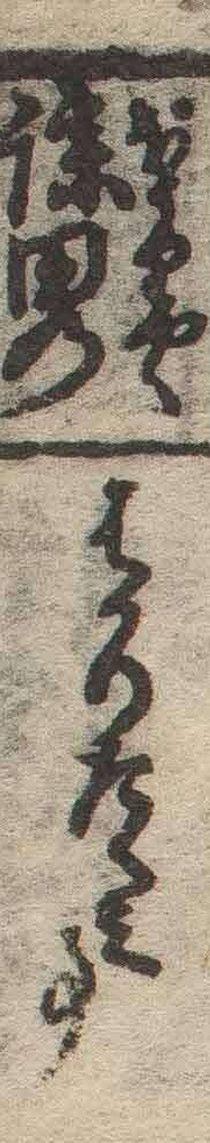謀畧はかりたくみ事
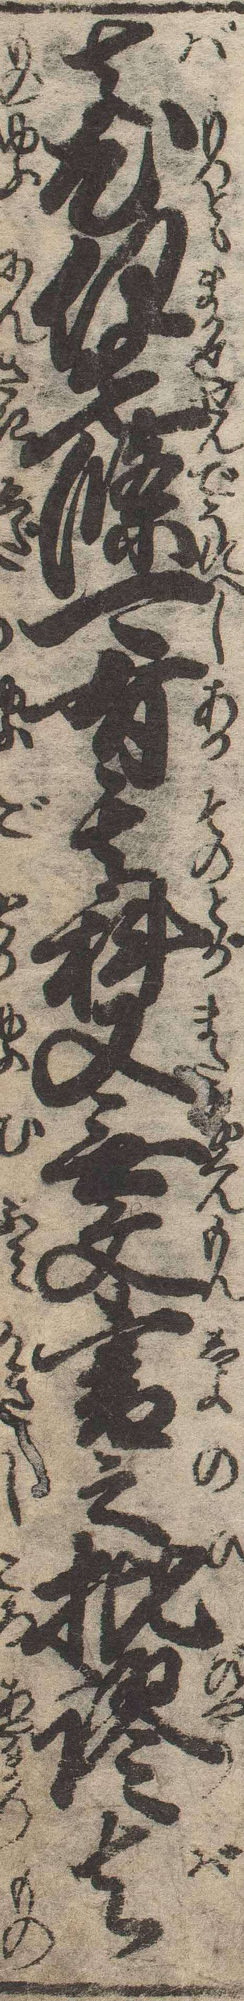者尤任先條可有其科又無文書之批謬者
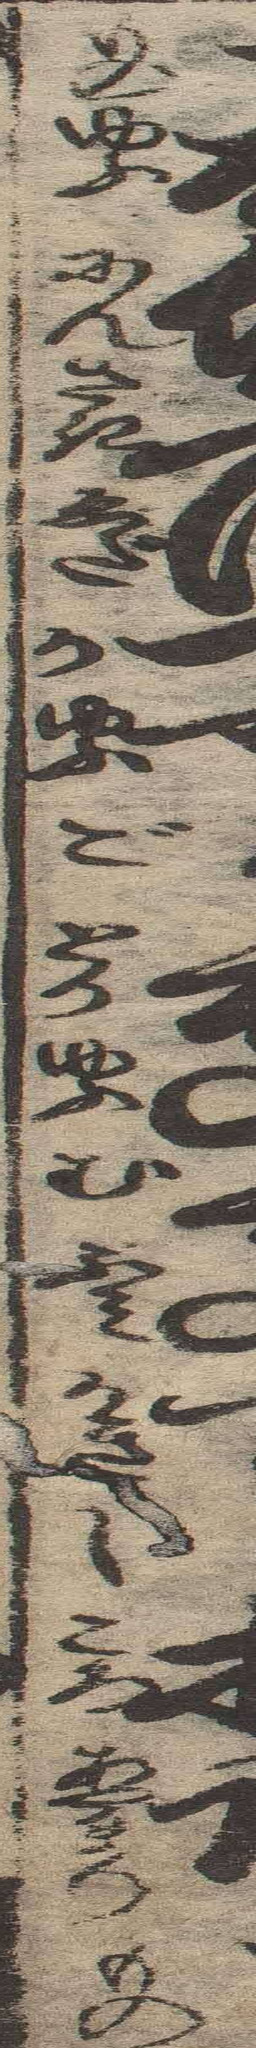ものゆふにんさきゑだかゆふごとかむふみかきしころあやまりもの

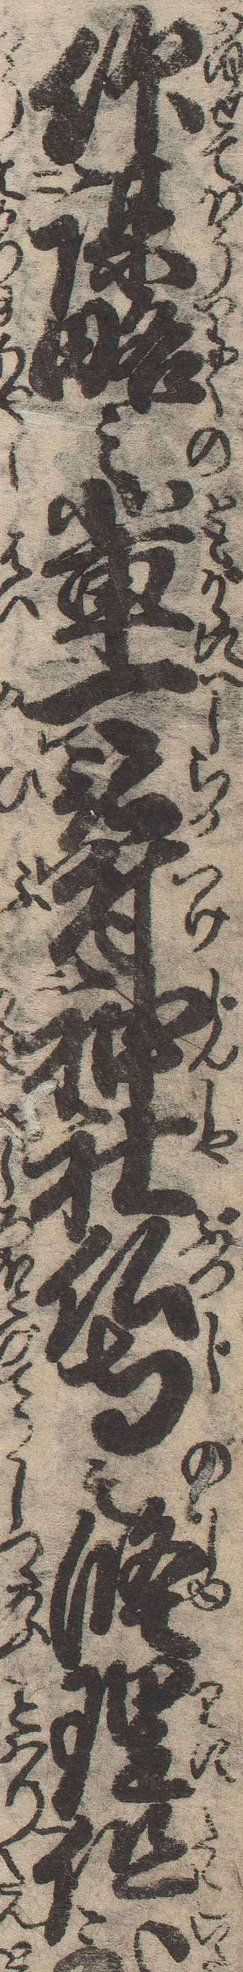仰謀略之輩可被付神社仏寺之修理但至
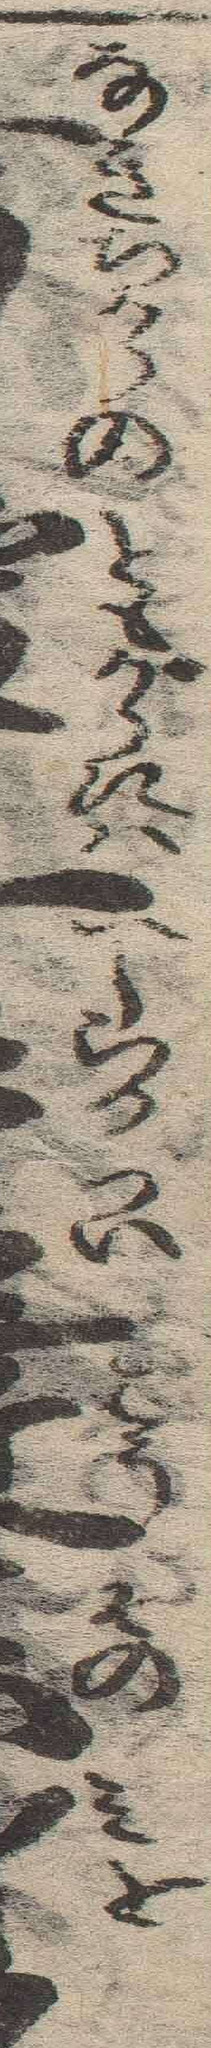なきちからのともがらにはへしらるついはうそのみを
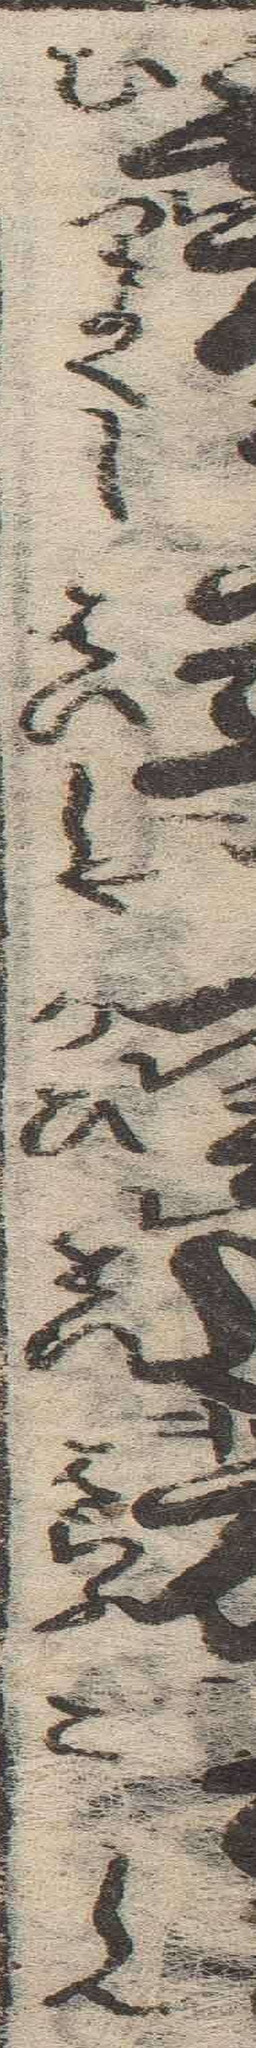むりよくしはいしやかひをいはらふこしん
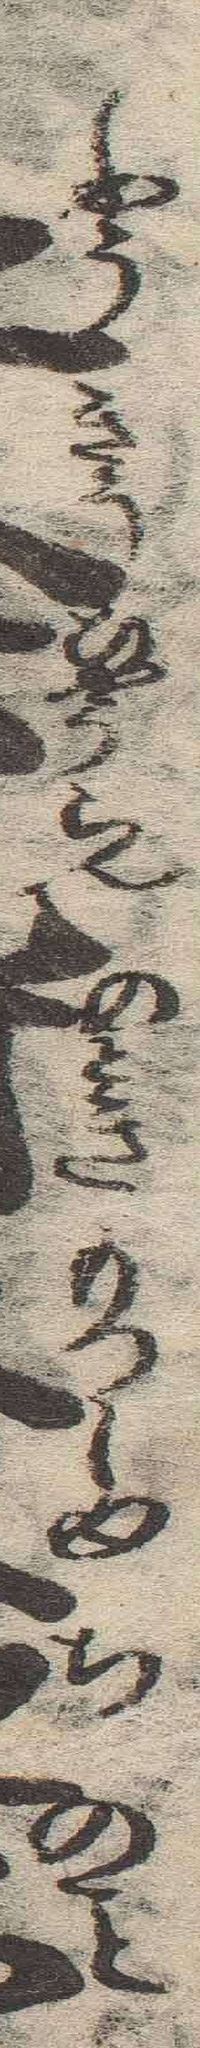しやうきうひやうらんのときもつしゆちのこと
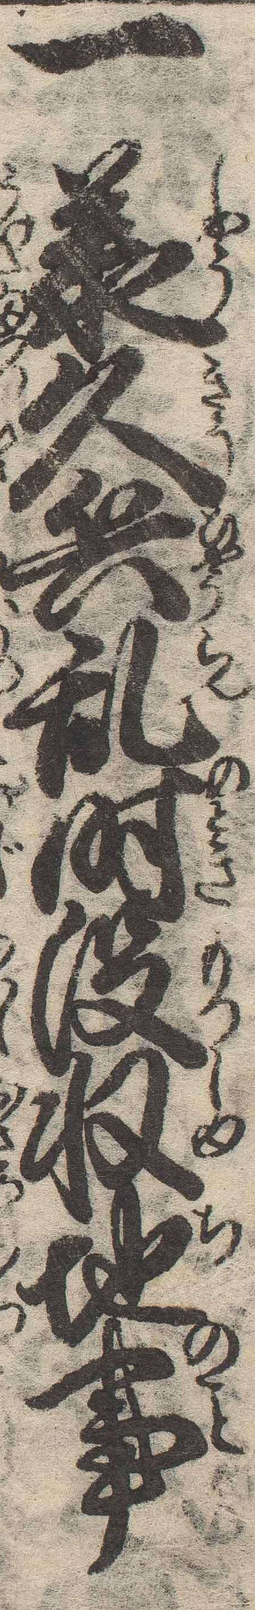一承久兵乱時没収地事
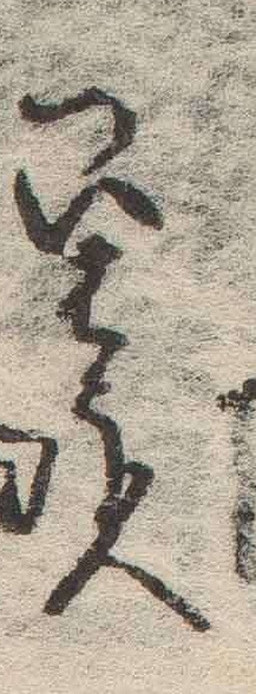ついはう人
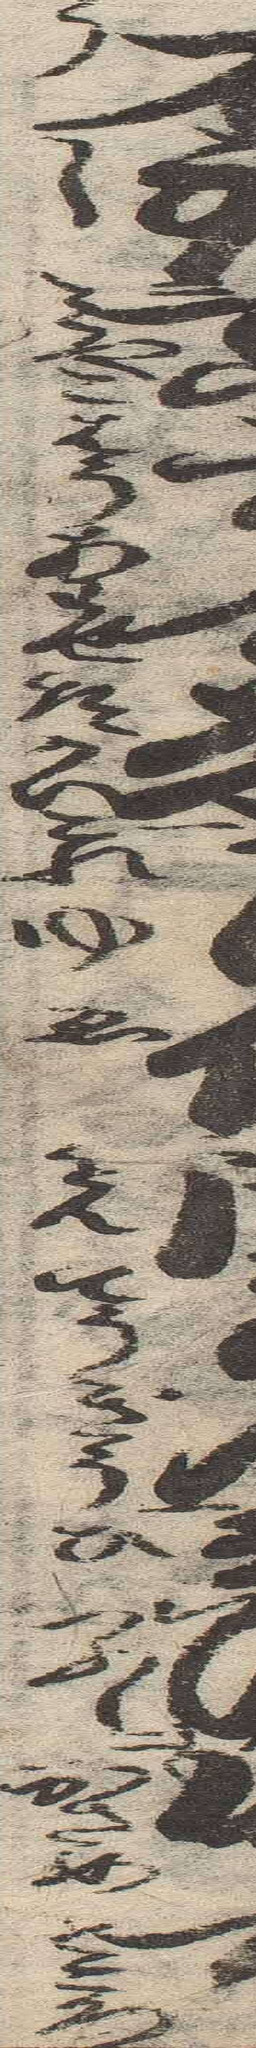うしみやこはうあわせたゝかいこれゆゑをんてうぎうひつぶしおさめところ
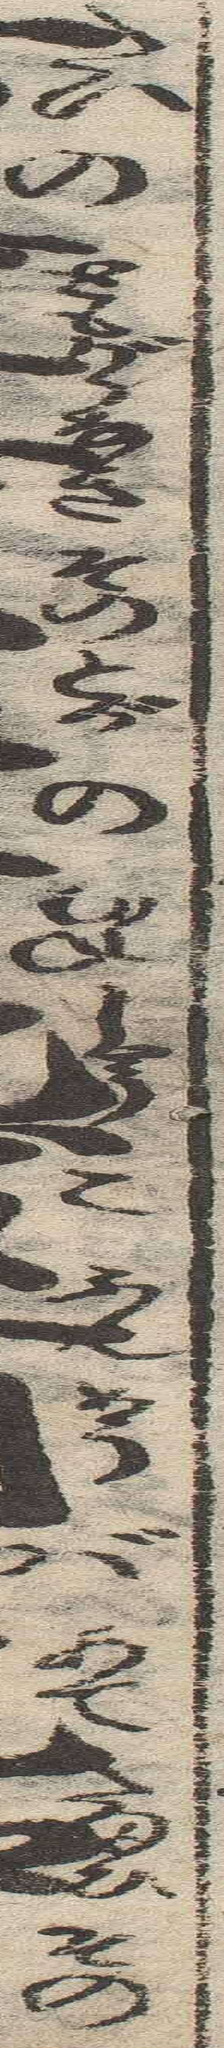たいのともがらなきそのとがのむねしやうこふんめうばあてたまひその
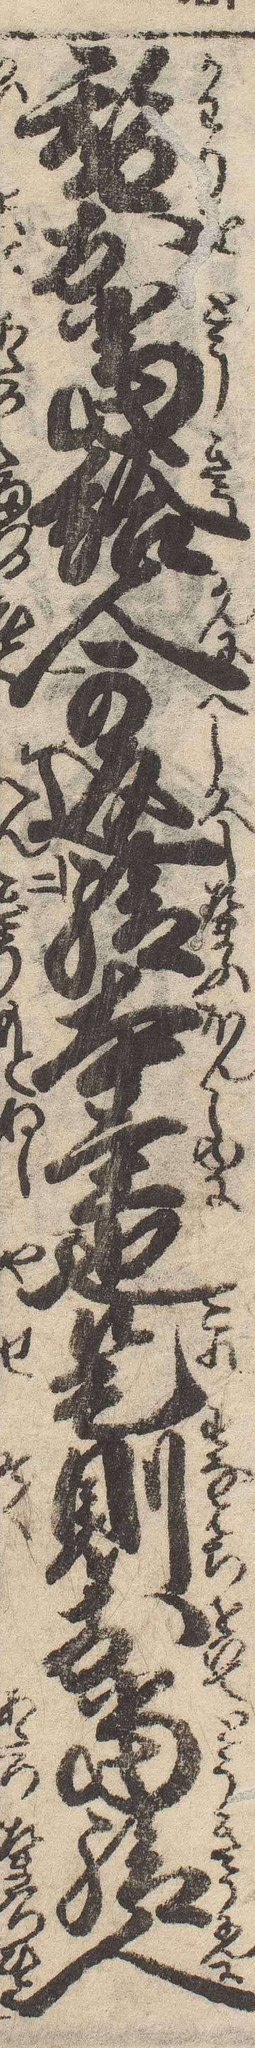替於當給人可返給本主也是則當給人
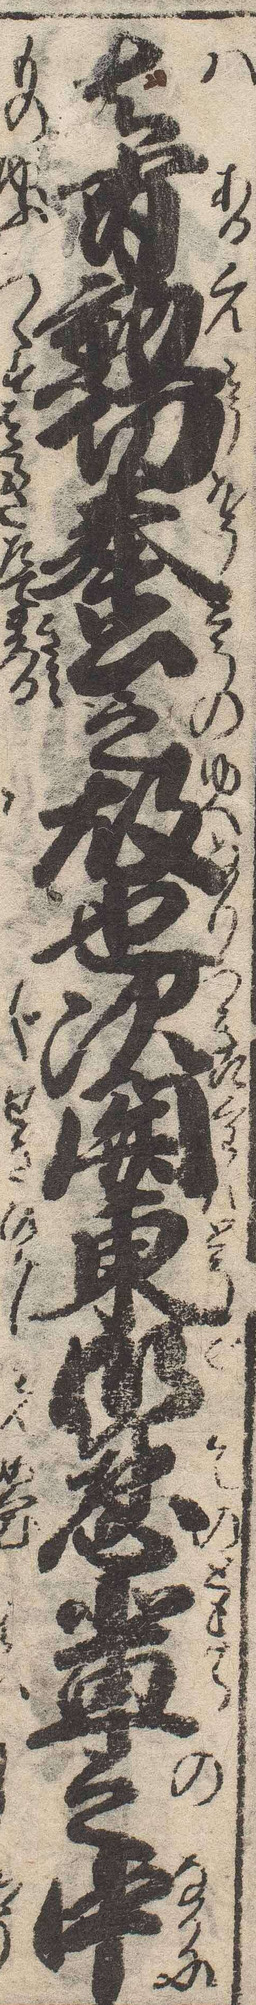者有勲功奉公之故也次関東御恩輩之中
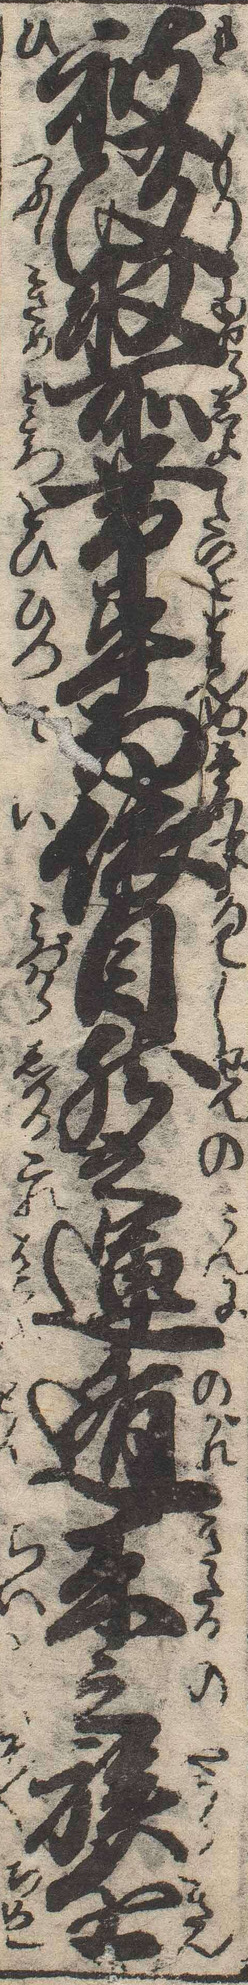被没収所帯畢而依自然之運遁来之族近
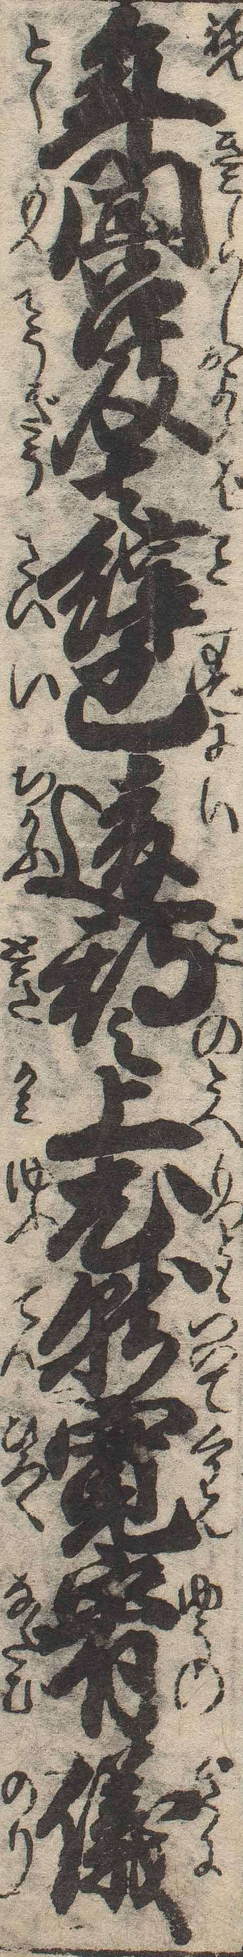年聞召及者縡已違期之上尤就寛宥儀
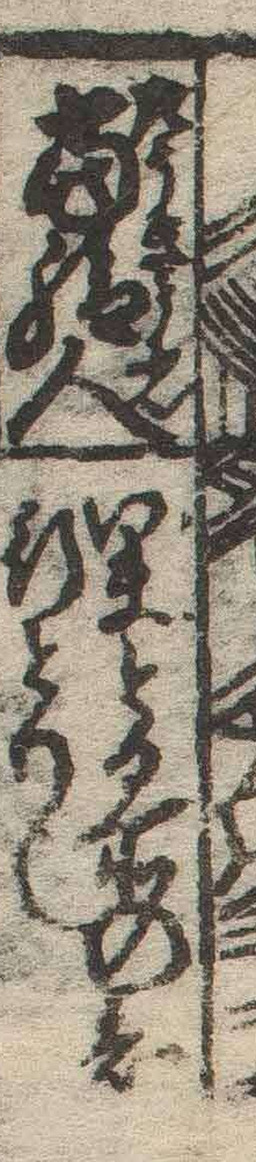當給人いまとる所の知
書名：御成敗式目絵抄
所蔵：東京学芸大学附属図書館 国文学研究資料館
